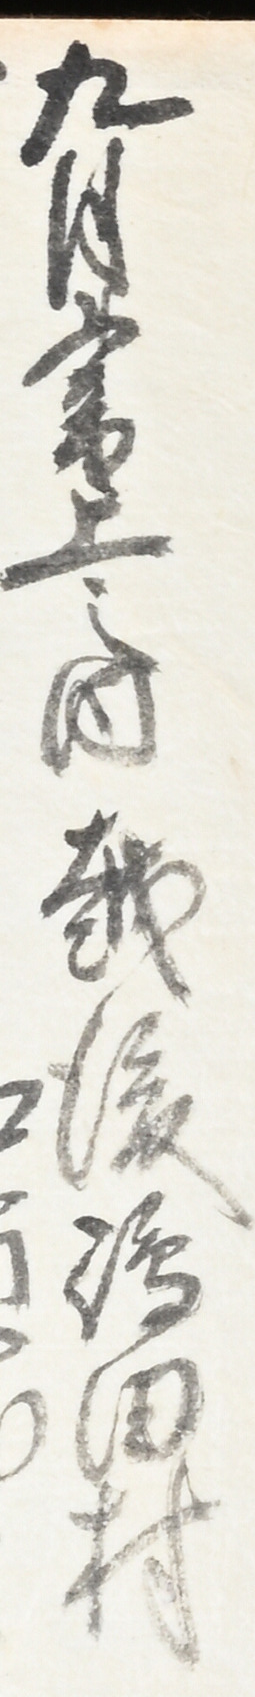九月書上之内越後嶋田村
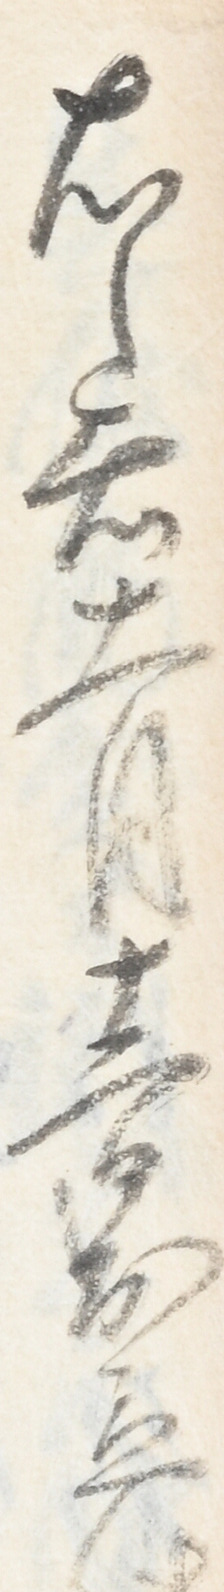右之者十一月十一日出立仕候
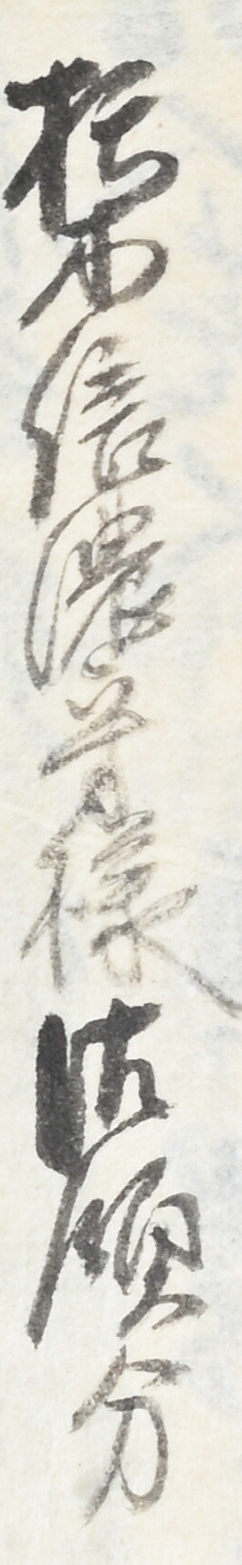朽木信濃守様御領分
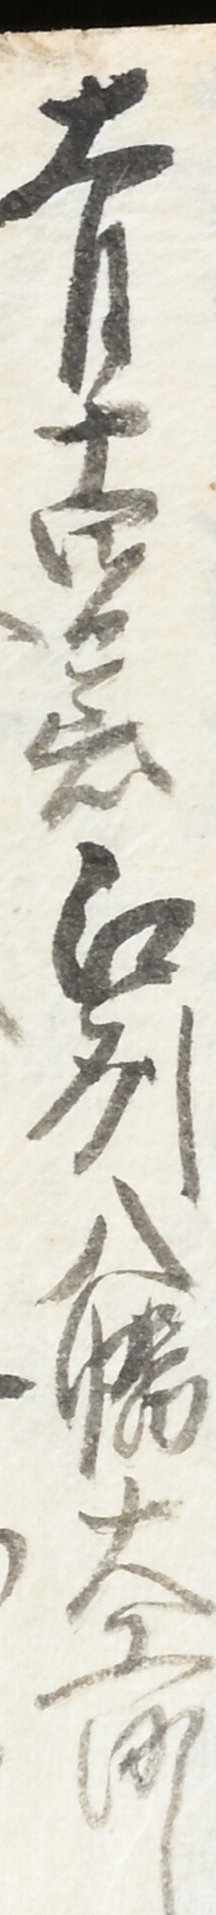十一月十一日着江州八幡大工町

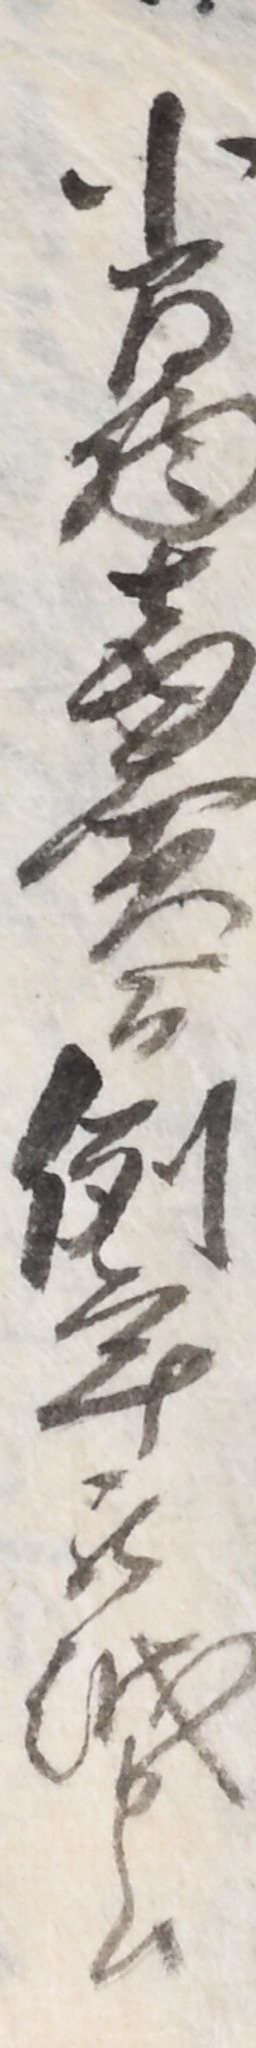小間物商売ニ而例年罷越申候
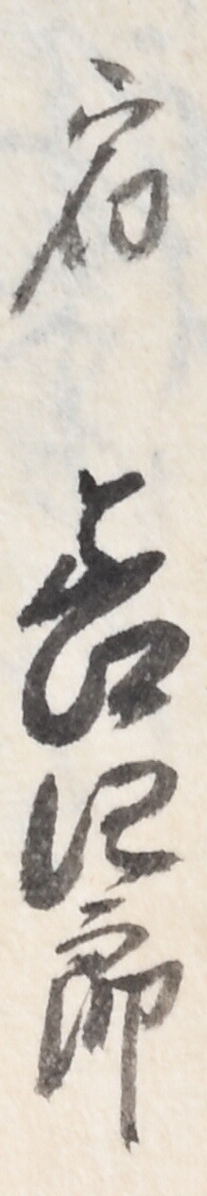宿善四郎
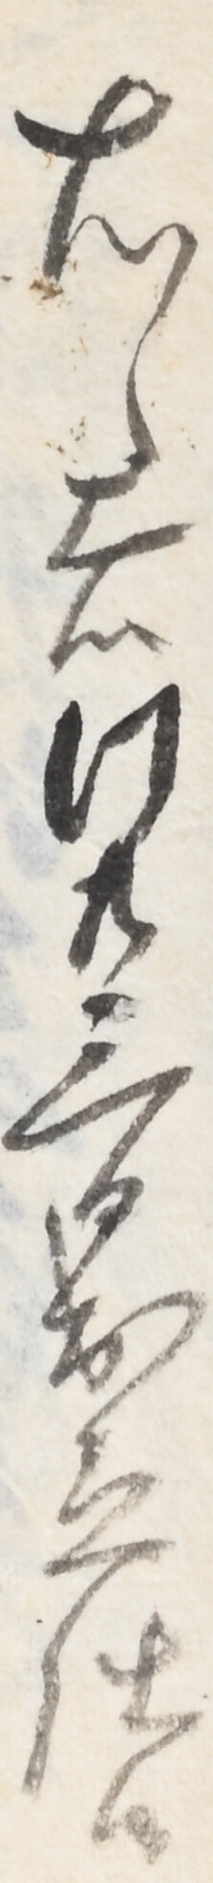右之者同廿六日出立仕候
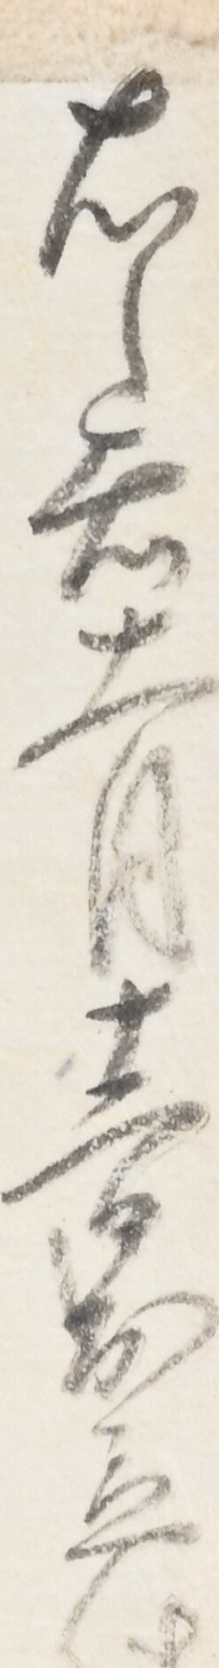右之者十一月十二日出立仕候
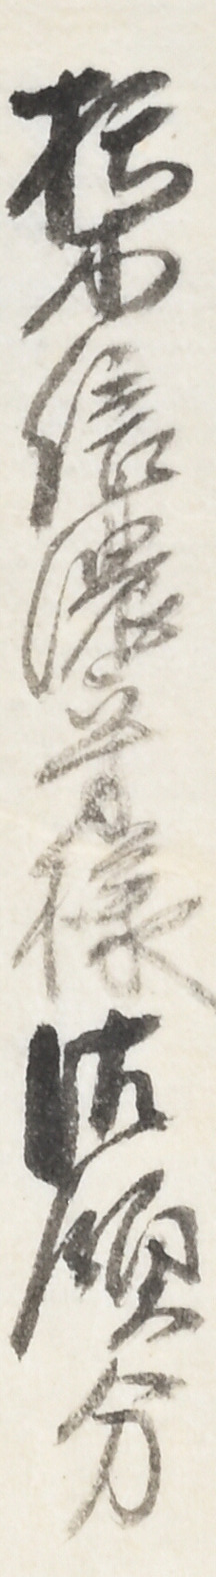朽木信濃守様御領分
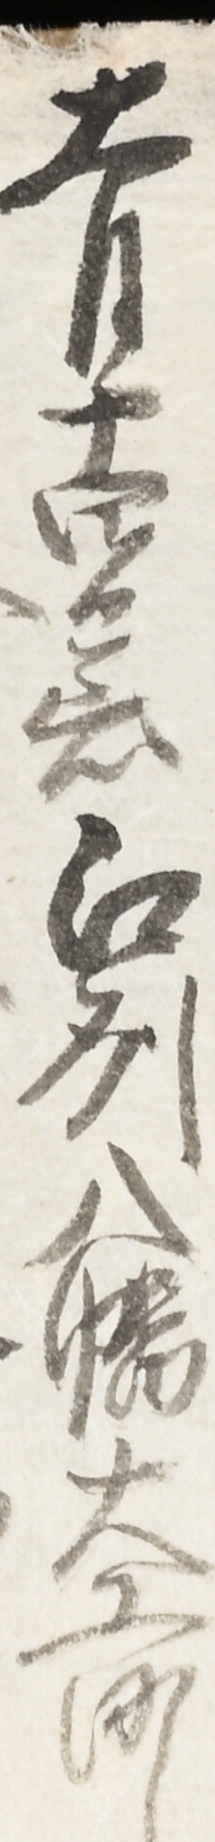十一月十四日着江州八幡大工町
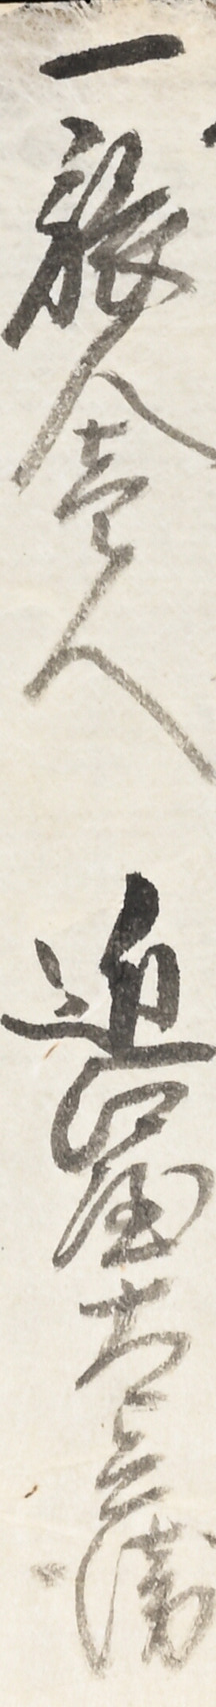一旅人壱人近江屋太兵衛・
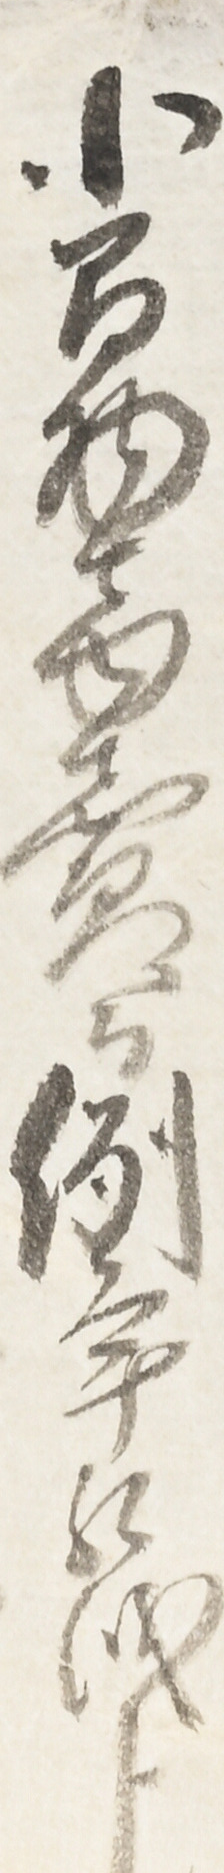小間物商売ニ而例年罷越申候
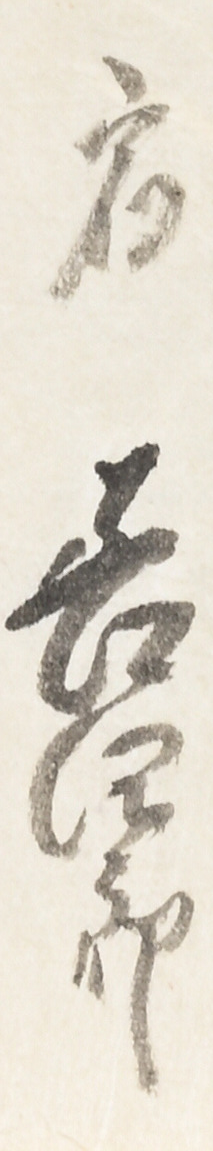宿善四郎
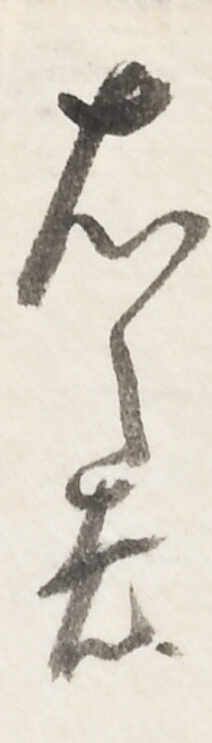右之者
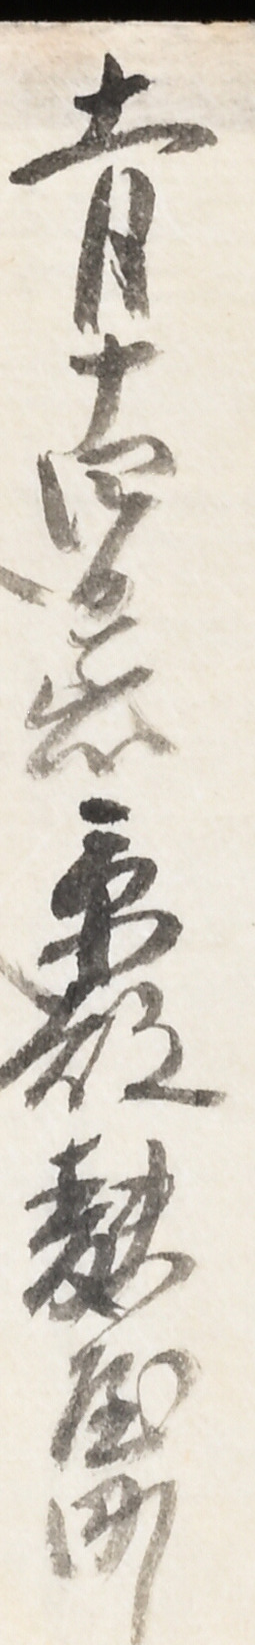十一月十四日着京都麩屋町
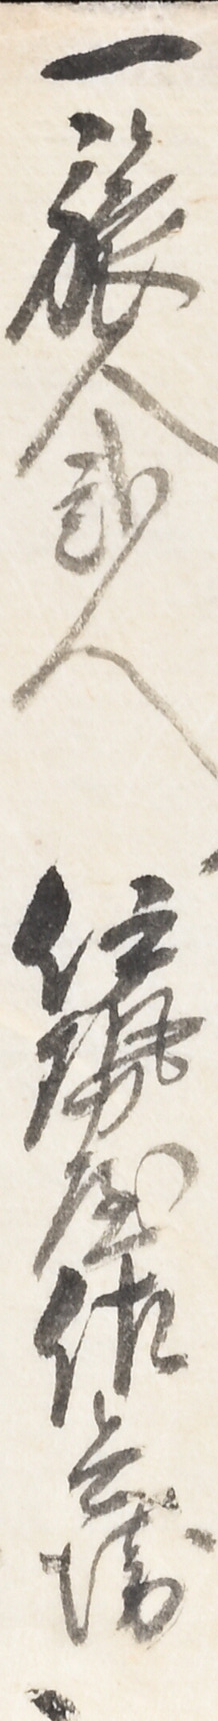一旅人弐人伊勢屋佐兵衛
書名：旅人泊控帳
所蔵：伊那市立高遠町図書館・合同会社AMANE
